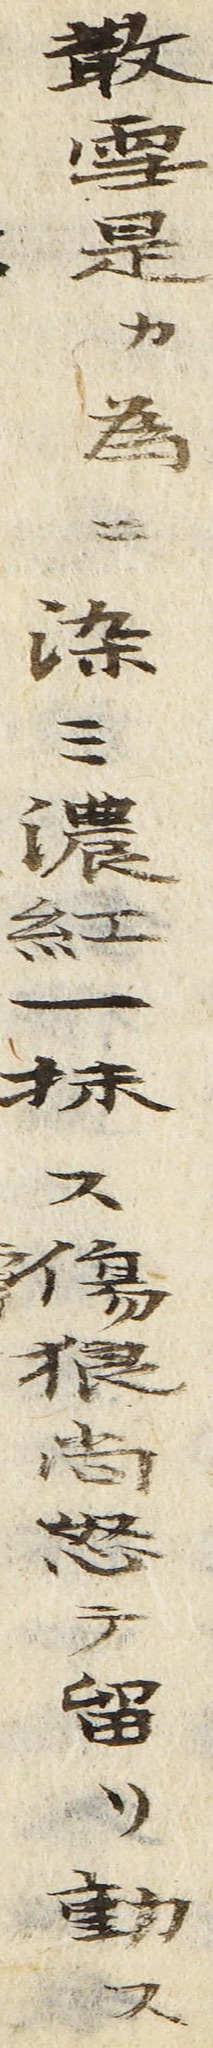散雪是カ為ニ染ミ濃紅一抹ス傷狼尚怒テ留リ動ス
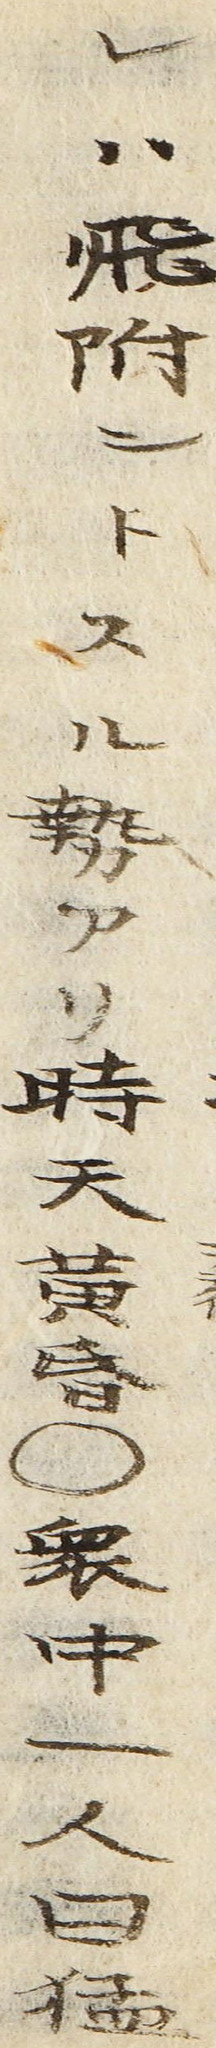レハ飛附ントスル勢アリ時天黄昏◯衆中一人曰猛
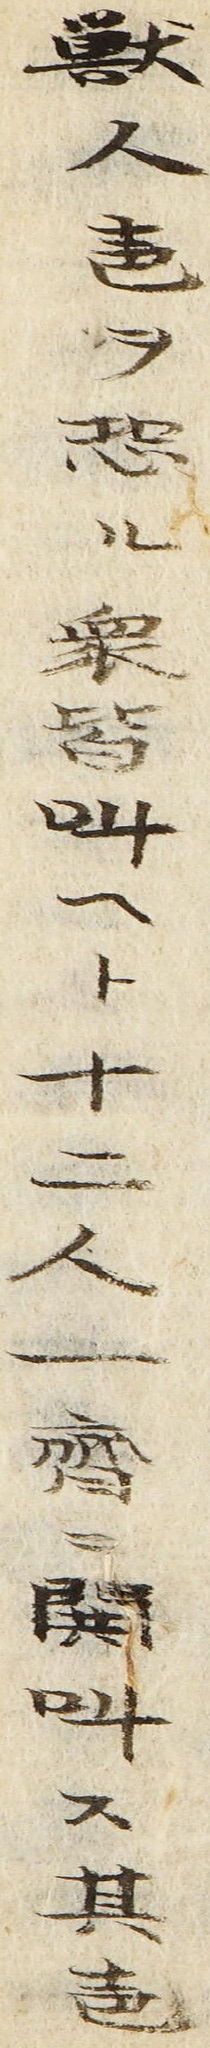獣人声ヲ恐ル衆皆叫ヘト十二人一斉ニ鬨叫ス其声

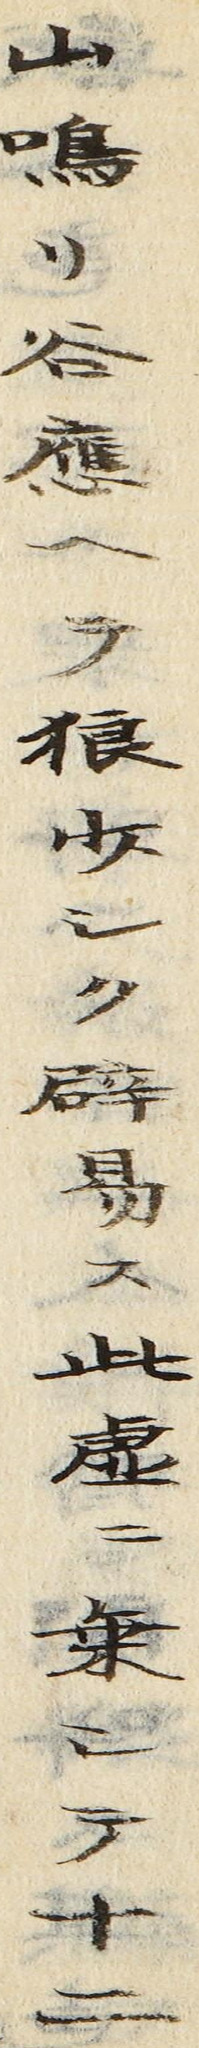山鳴リ谷応ヘテ狼少シク辟易ス此虚ニ乗シテ十二
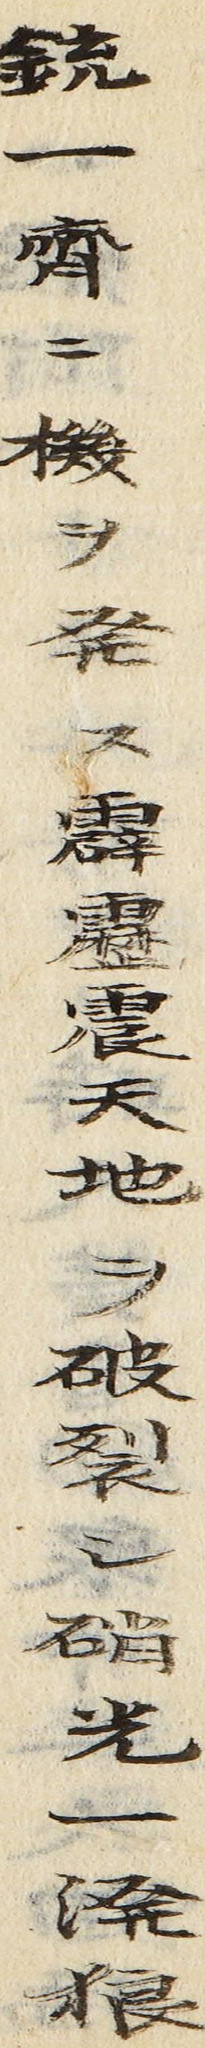銃一斉ニ機ヲ発ス霹靂震天地ヲ破裂シ硝光一潑狼
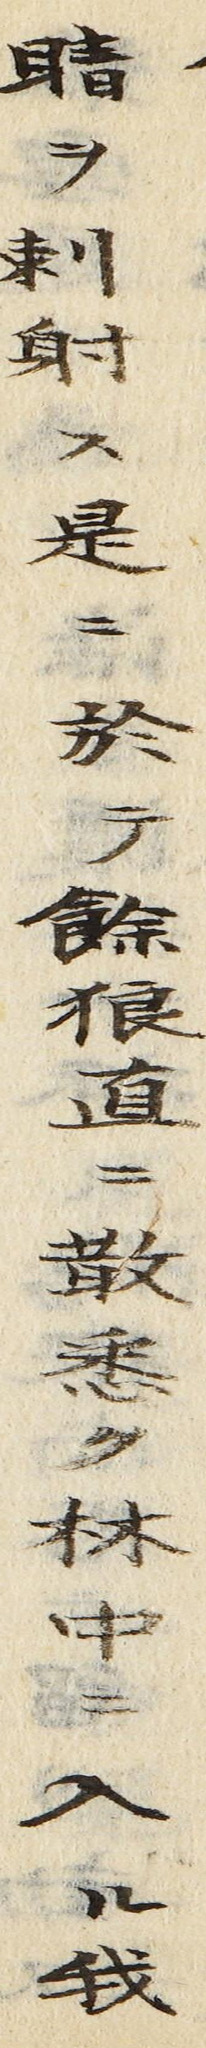睛ヲ刺射ス是ニ於テ余狼直ニ散悉ク林中ニ入ル我
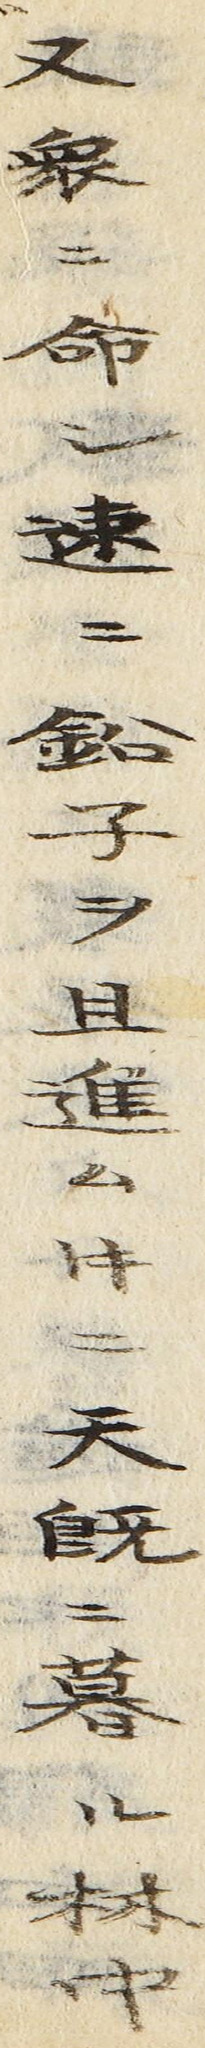又衆ニ命シ速ニ鉛子ヲ且進ムトキニ天既ニ暮ル林中
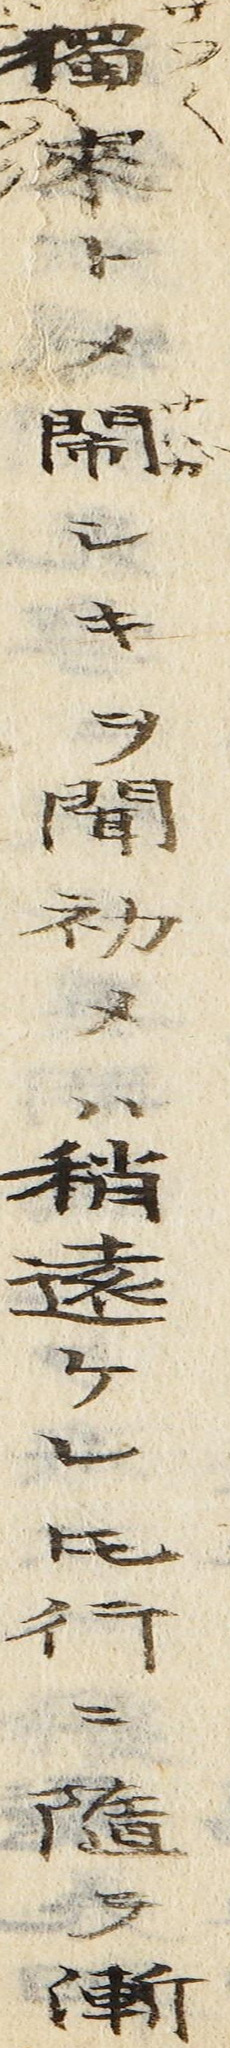独来トシテ閙シキヲ聞初メハ稍遠ケレトモ行ニ随テ漸
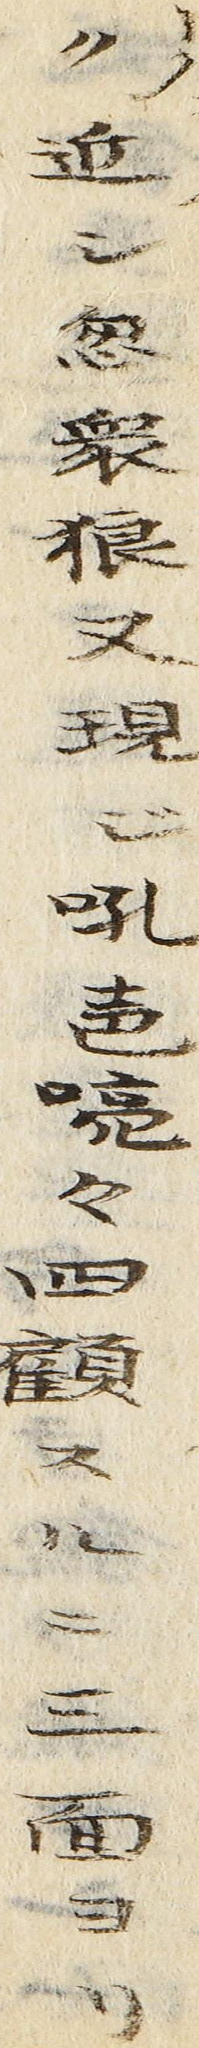ク近シ忽衆狼又現ジ吼声喨々四顧スルニ三面ヨリ
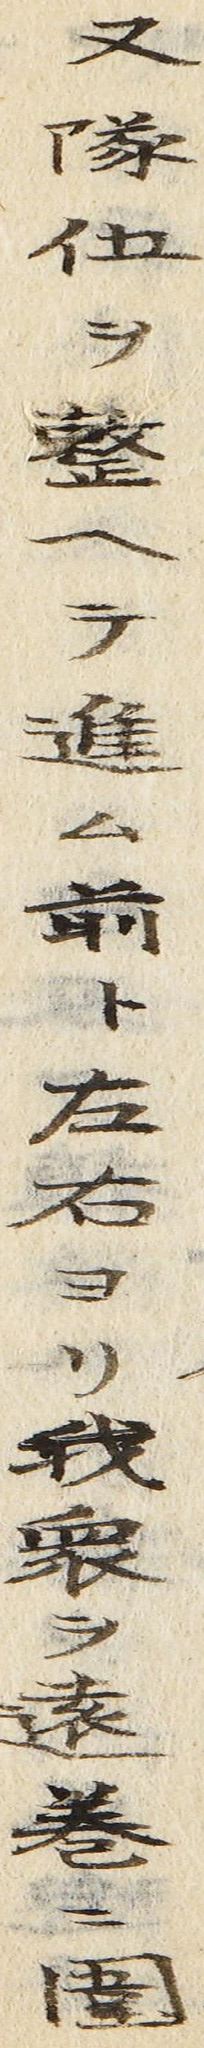又隊伍ヲ整ヘテ進ム前ト左右ヨリ我衆ヲ遠巻ニ囲
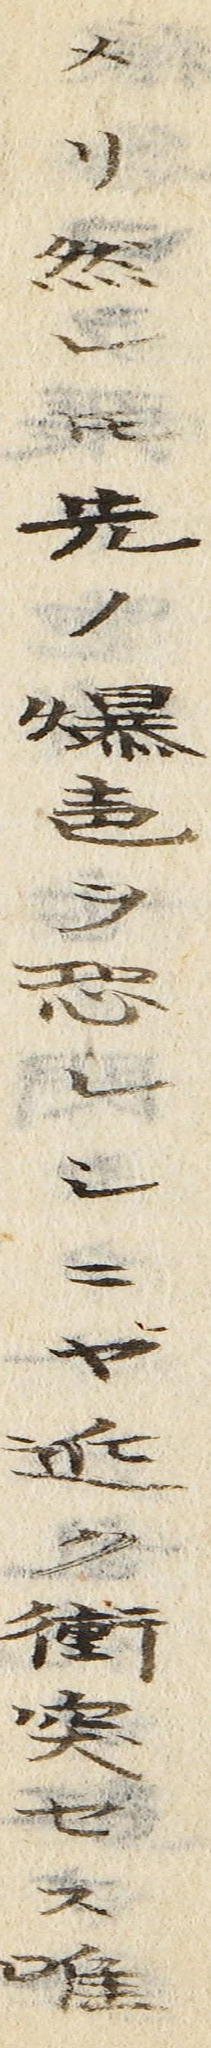メリ然レトモ先ノ爆声ヲ恐レシニヤ近ク衝突セス唯
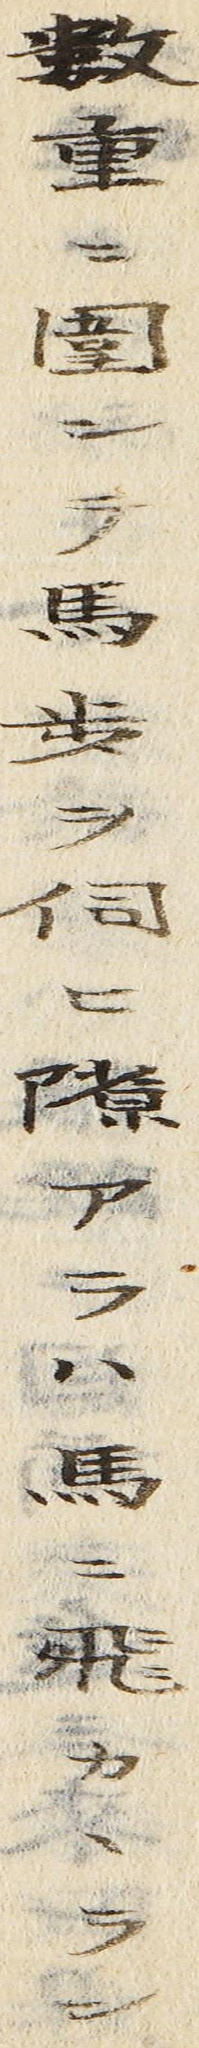数重ニ囲ンテ馬歩ヲ伺ヒ隙アラハ馬ニ飛カヽラン
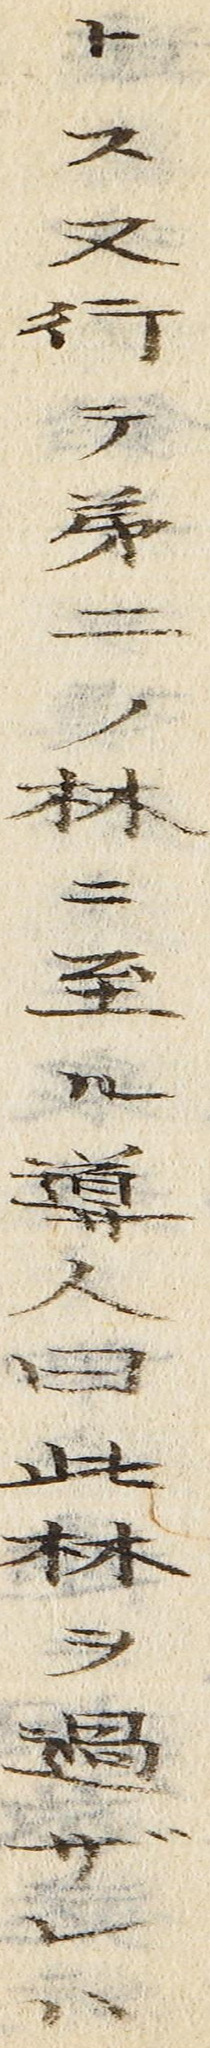トス又行テ第二ノ林ニ至ル導人曰此林ヲ過ザレハ
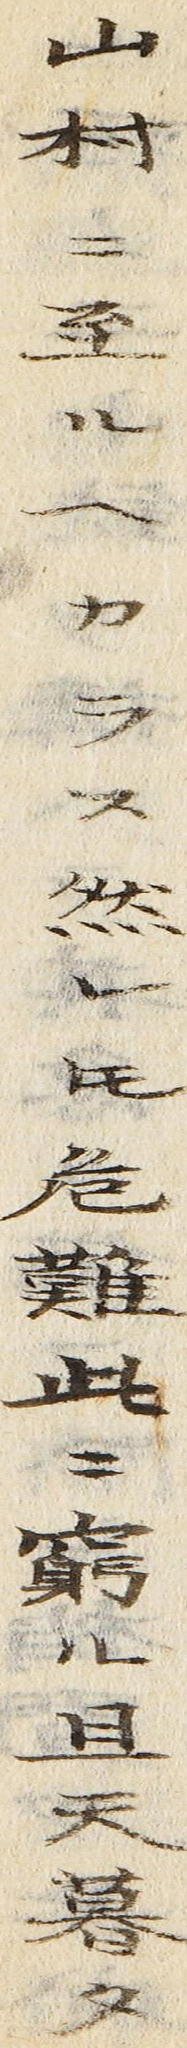山村ニ至ルヘカラス然レトモ危難此ニ窮ル且天暮タ
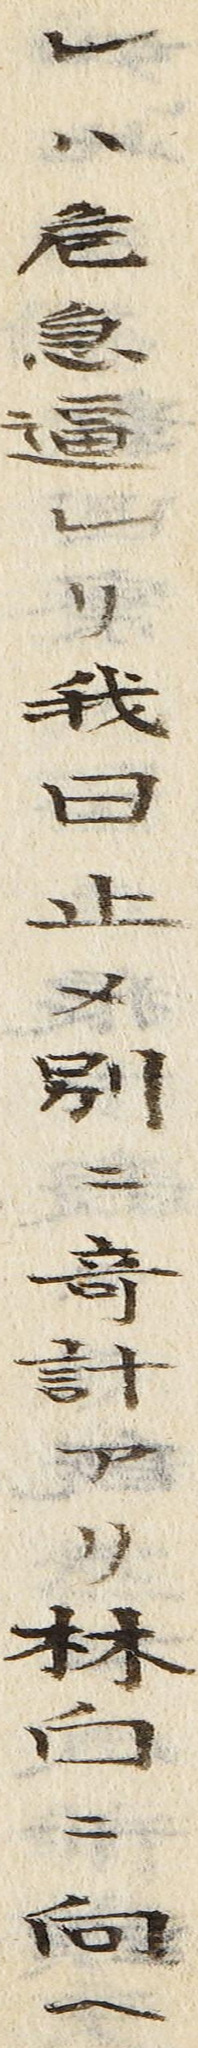レハ危急逼レリ我曰止メ別ニ奇計アリ林口ニ向ヘ
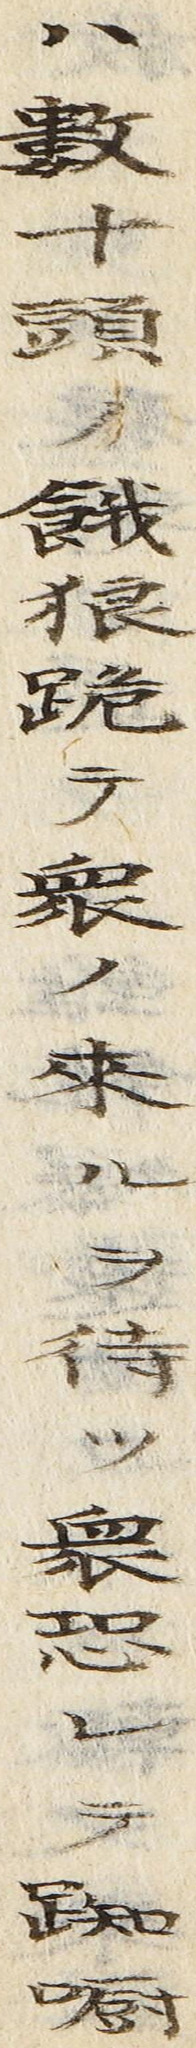ハ数十頭ノ餓狼跪テ衆ノ来ルヲ待ツ衆恐レテ踟
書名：漂流紀事
